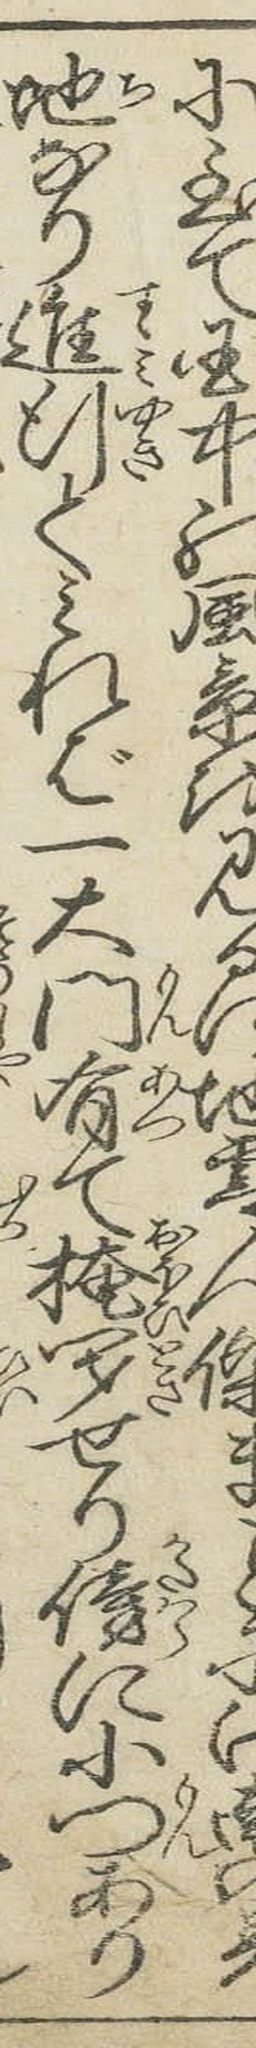地なり進行てみれば一大門有て掩閉せり傍に小門あり
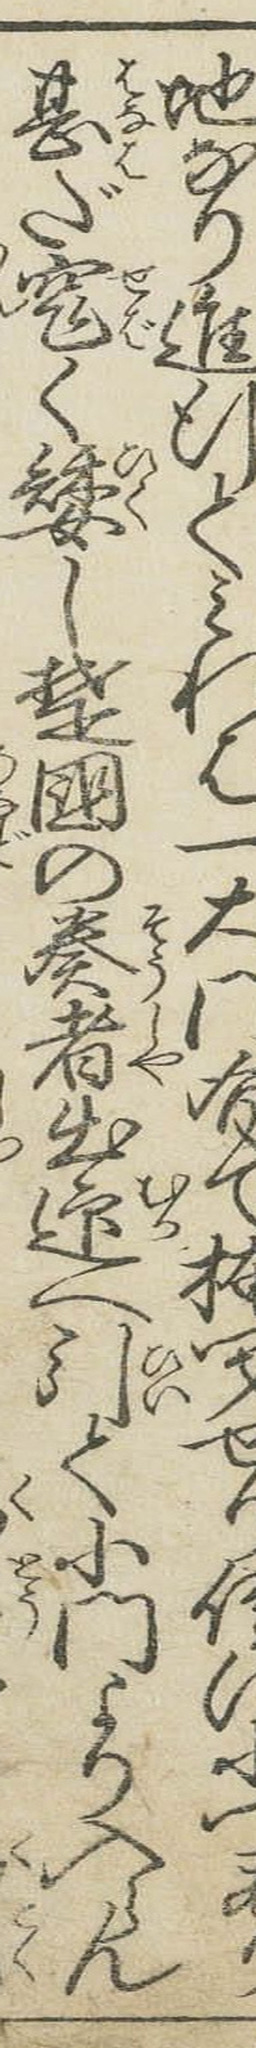甚だ窄く矮し楚国の奏者出迎へ引て小門より入らん
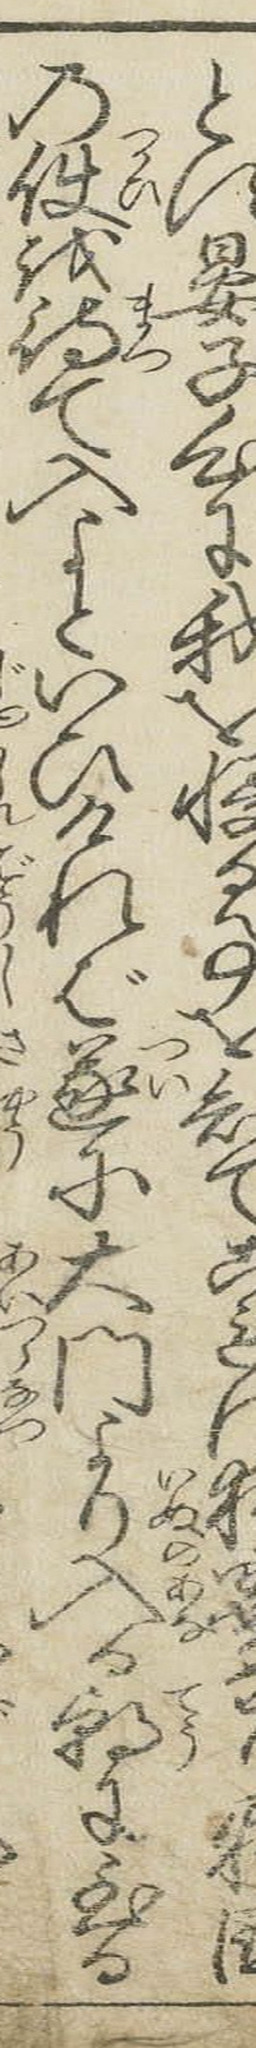の使を待て入よといひければ遂に大門より入る朝に至る
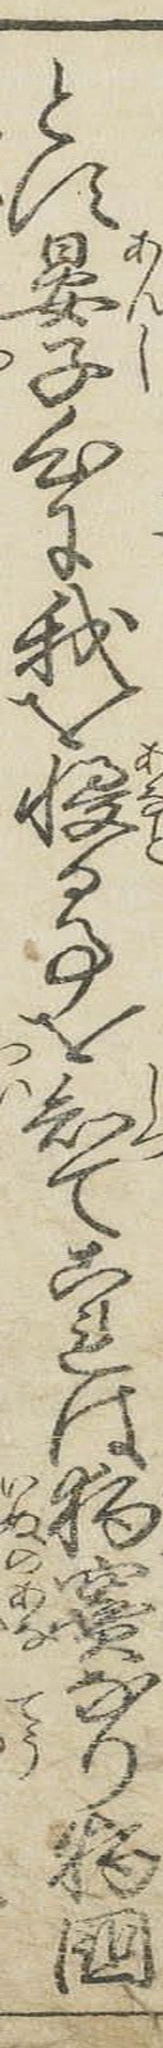とす晏子心に我を慢る事を知てこれは狗竇なり狗国
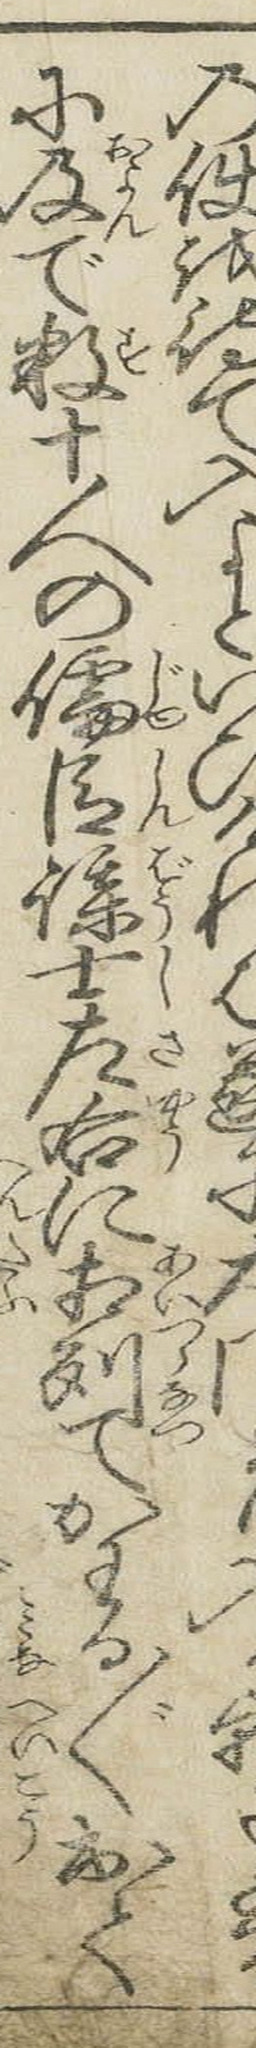に及で数十人の儒臣謀士左右に相列てかわる〴〵出て
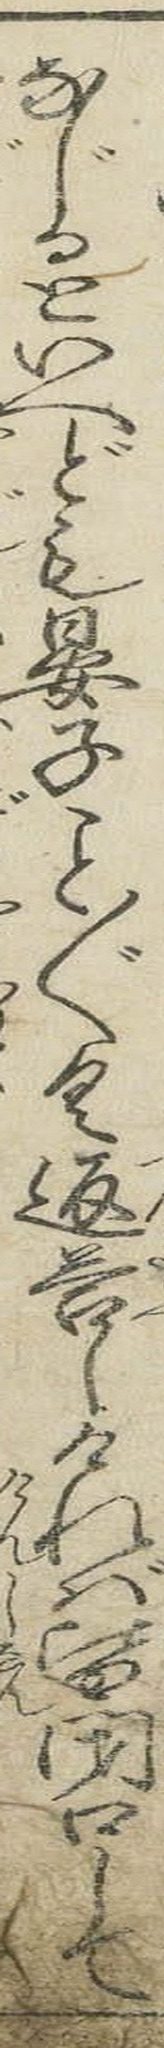なじるといへども晏子こと〴〵く返答しければ皆閉口して
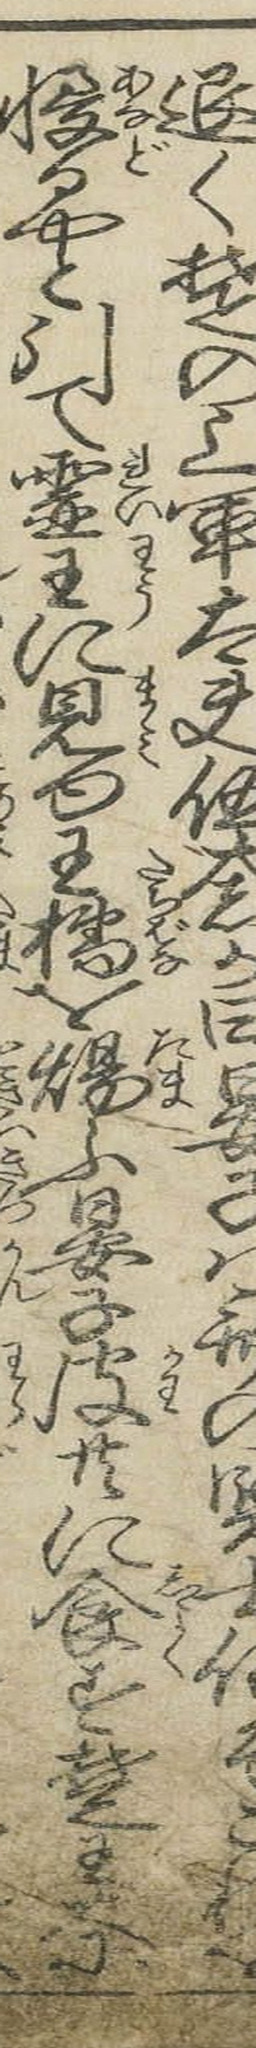慢るやと引て霊王に見ゆ王橘を賜ふ晏子皮共に食す楚王大に
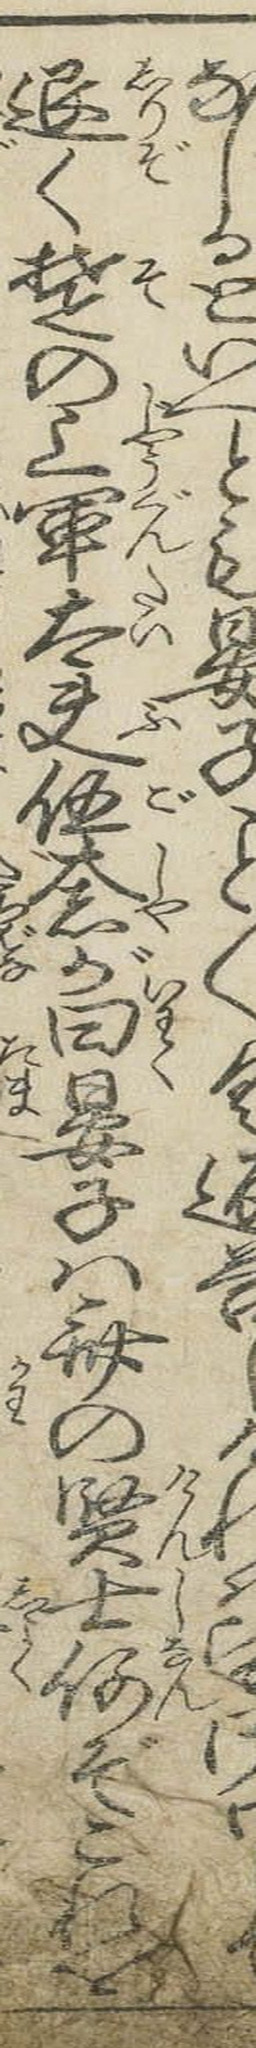退く楚の上軍太夫伍奢が曰晏子は斉の賢士何ぞこれを
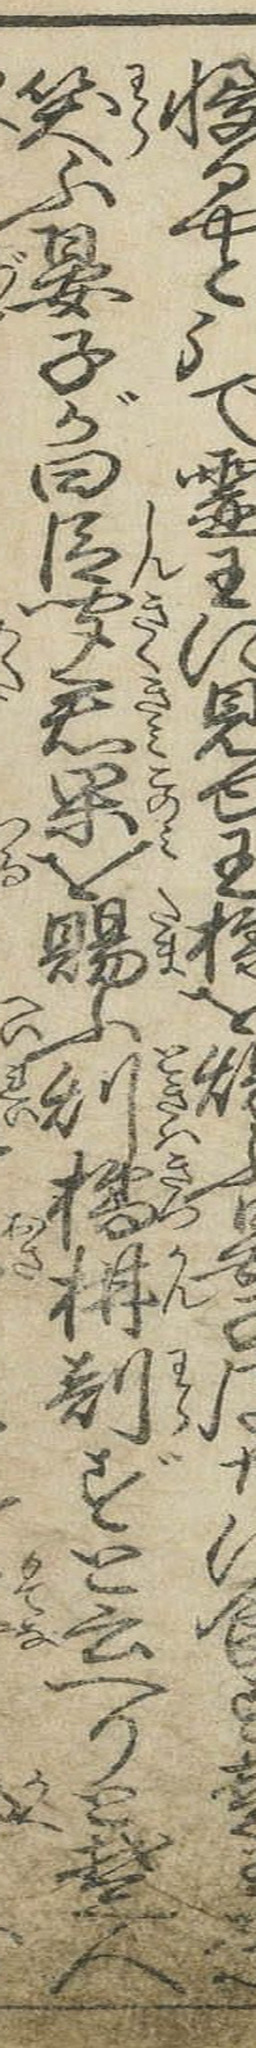笑ふ晏子が曰臣聞君果を賜ふ刻橘柑割ずと云へりと楚人
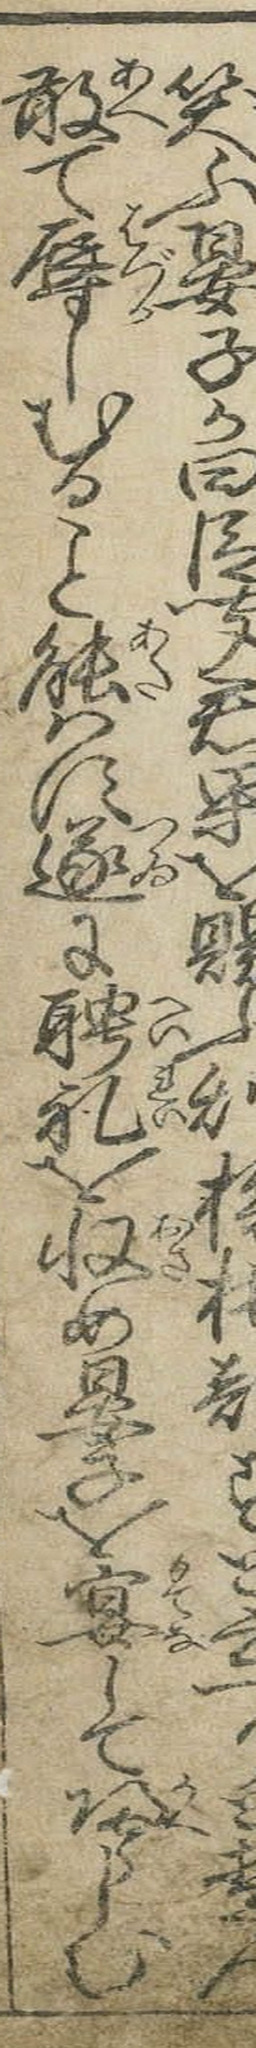敢て辱しむること能はす遂に聘礼を収め晏子を宴して帰らしむ

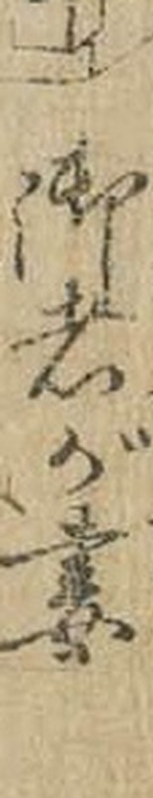御者が妻
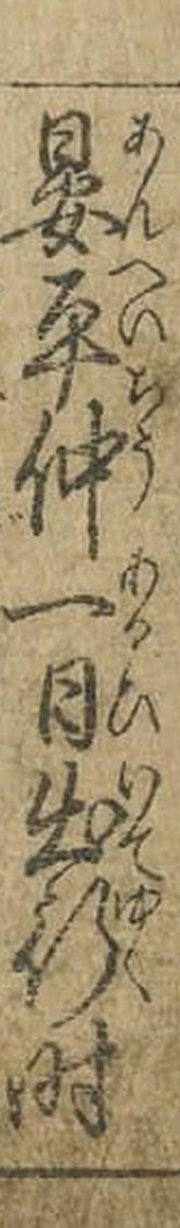晏平仲一日出行時
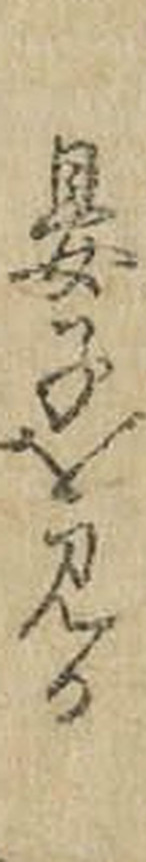晏子を見る
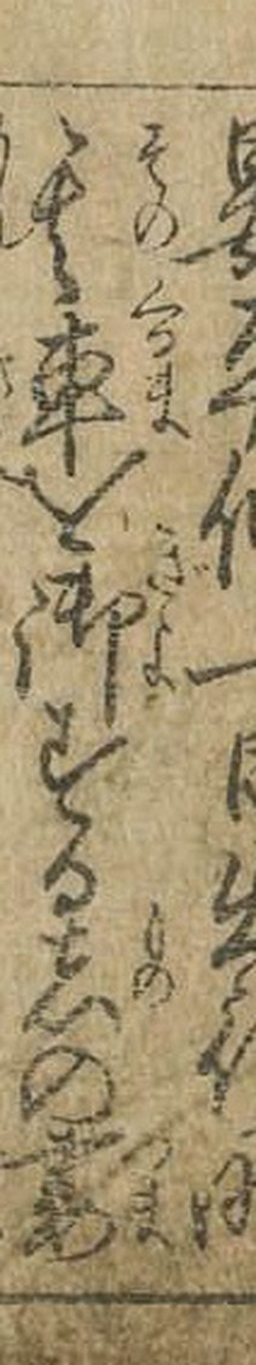其車を御する者の妻
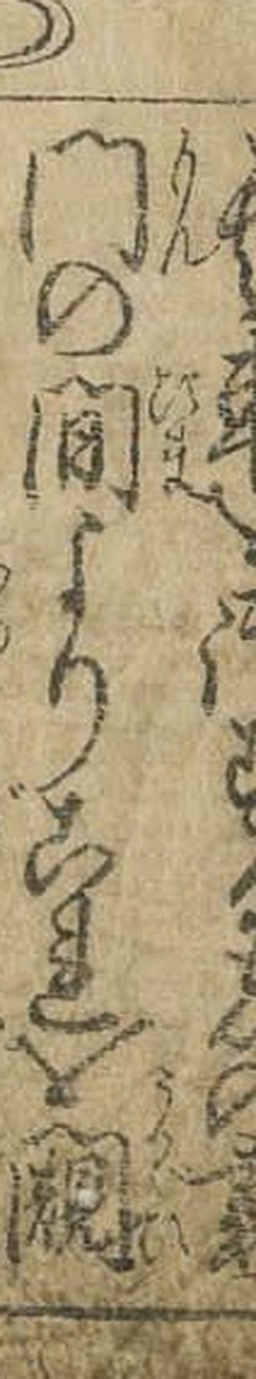門の間よりこれを闚
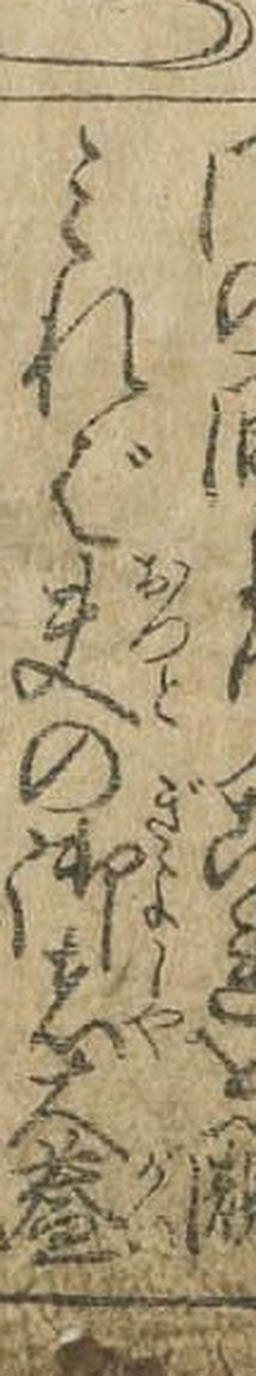みれば夫の御者大蓋
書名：絵本写宝袋 9巻 6之巻
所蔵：東京学芸大学教育コンテンツアーカイブ
